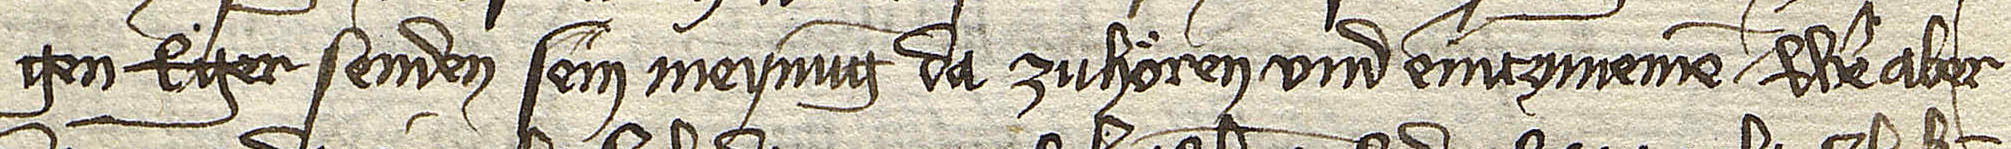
gen Eger ſenden ſein meynu*g da ʒu hören vnd eincʒuneme* / W*e aber
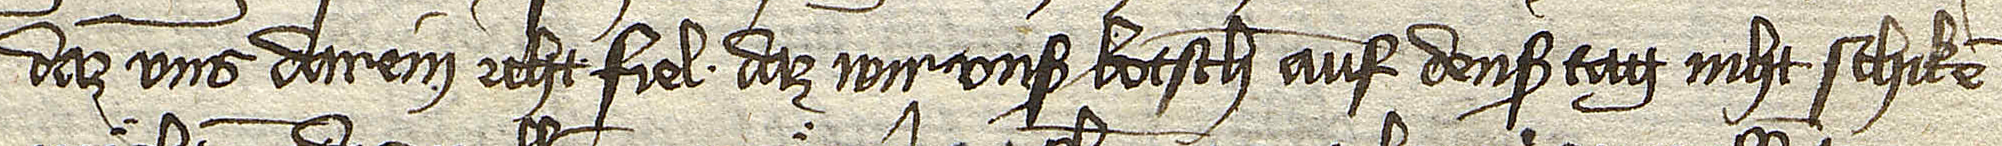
daʒ vns darein icht fiel . daʒ wir vnſ* botſch* auf denſ* tag niht ſchike*
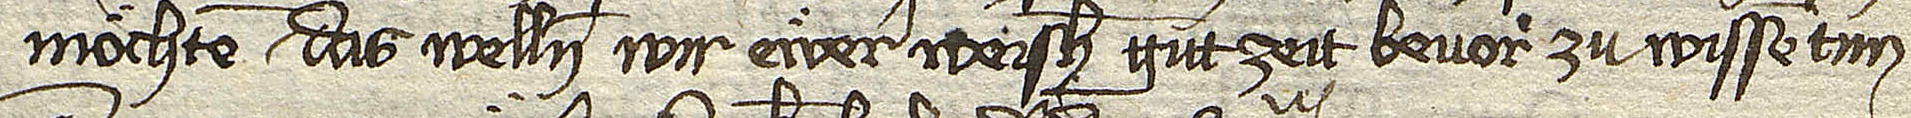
möchte* / das welln* wir eẅer* weiſh* gut ʒeit beuor ʒu wiſſe* tun
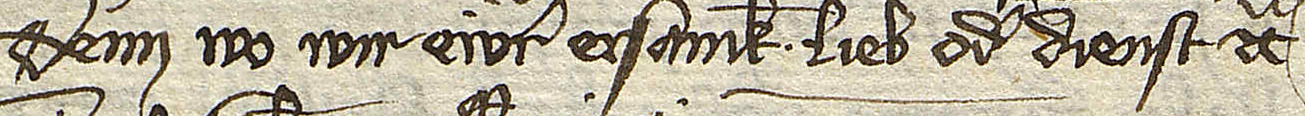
Denn wo wir eẅr* erſamk* lieb od* dienſt ec*
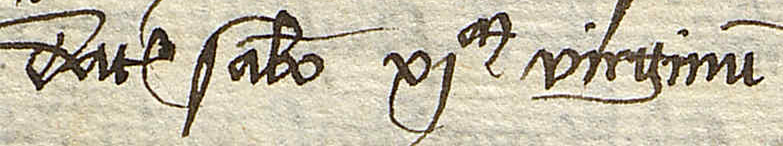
Dat* ſabo* xi* virginu*
